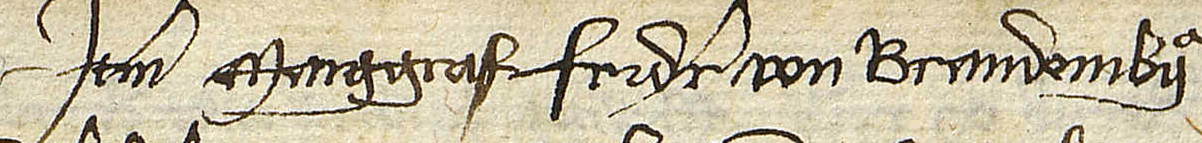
It*m Marggraf Fridr* von Brandemb*g
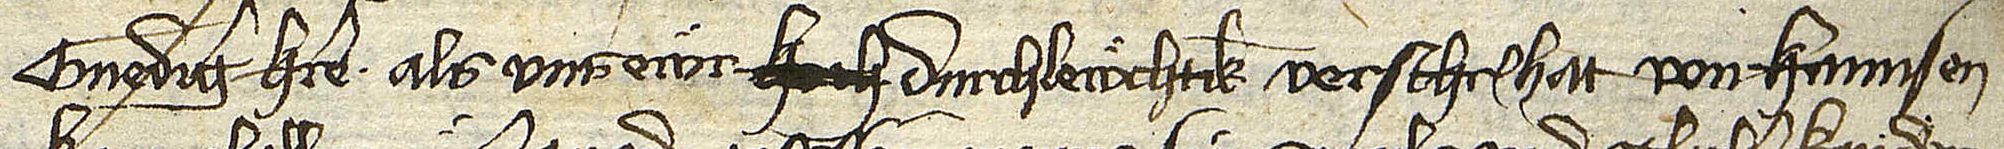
Gnedig* h*re . als vns ewr hoch durchlewchtik* verſchr* hat von Hannſen
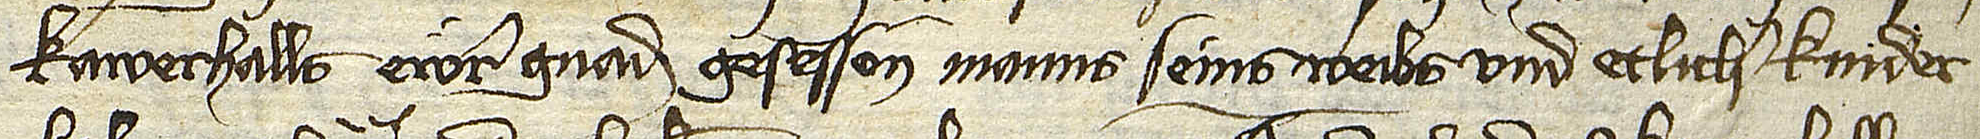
kawerhalls ew*r gnad* geſeſſen manns ſeins weibs vnd etlich* kinder
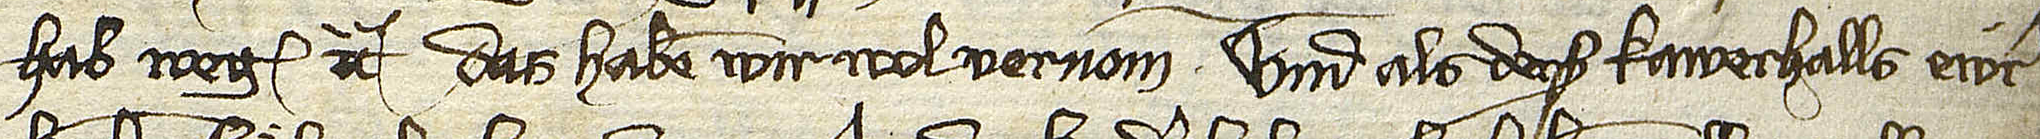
hab weg* ec* das habe* wir wol vernom* . Vnd als derſ* kawerhalls ew*r
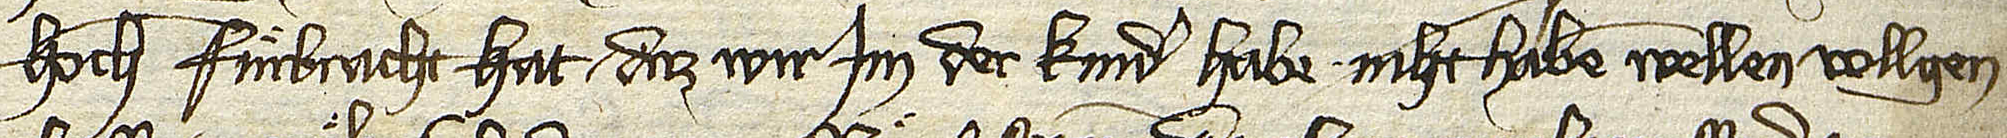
hoch* fürbracht hat / daʒ wir Im der kind* habe . niht habe* wellen vollgen
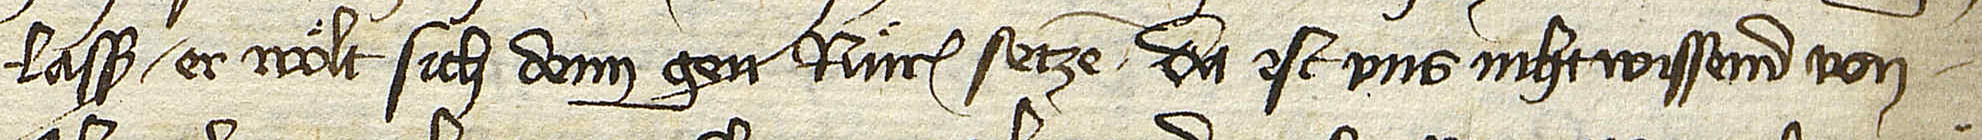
laſſ* / er wölt ſich denn gen Nür* ſecʒe* . da iſt vns niht wiſſend von /
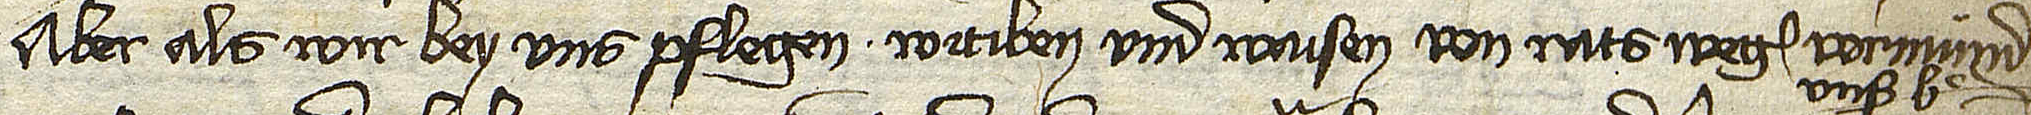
Aber als wir bey vns pflegen . witiben vnd waiſen von rats weg* vormünd*
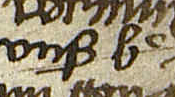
vnſ* b*
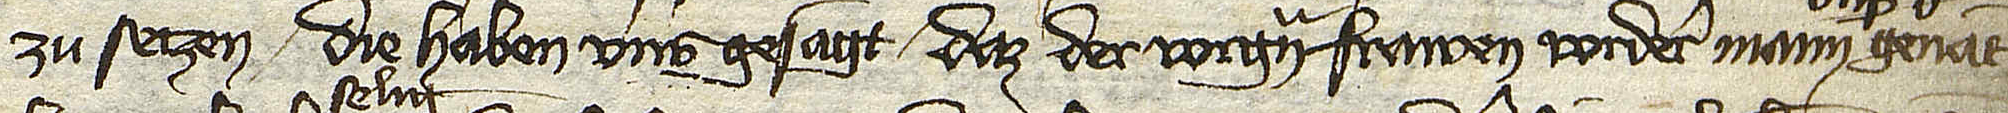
ʒu ſecʒen / die haben vns geſagt / daʒ der vorg*n frawen vorder*mann gena*t
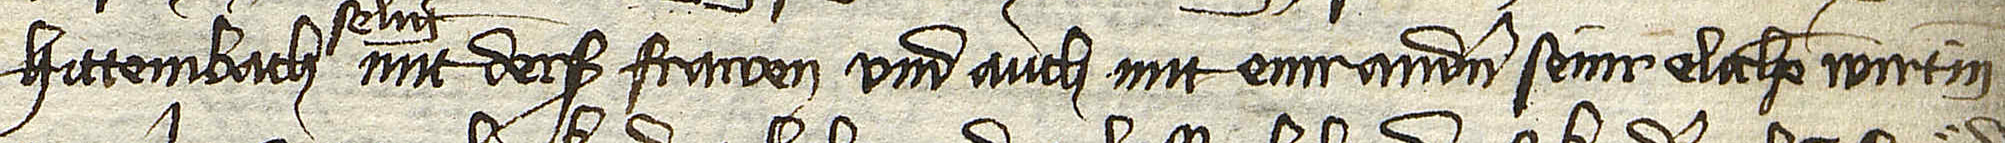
hittembach mit derſ* frawen vnd auch mit einr and*n ſeinr eliche* wirtin*
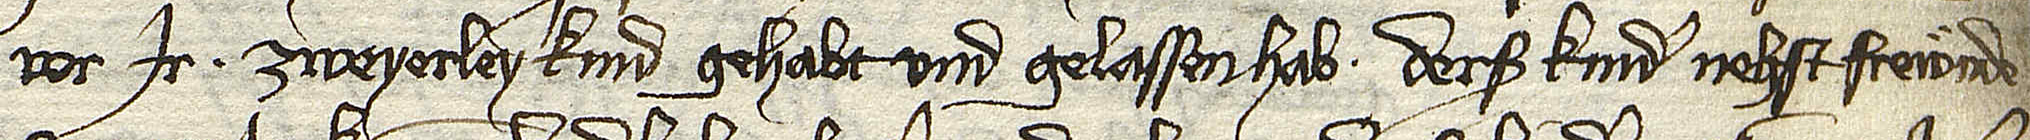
vor Ir . ʒweyerley kind gehabt vnd gelaſſen hab . derſ* kind* nehſt frewnde
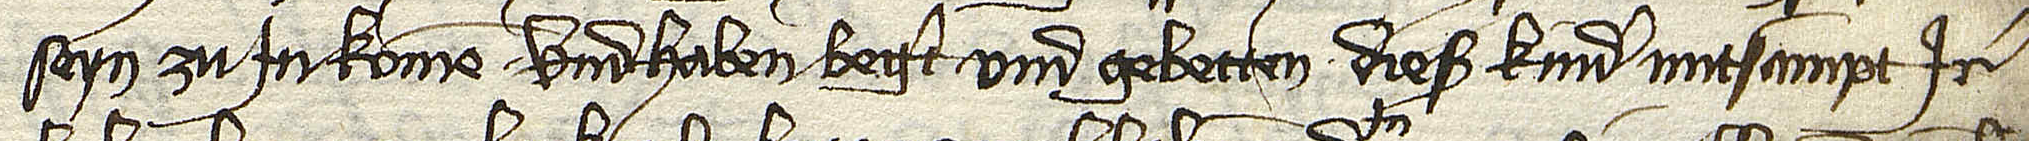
ſeyn ʒu In kome* . Vnd haben beg*t vnd gebetten . dieſ* kind* mitſampt Ir*
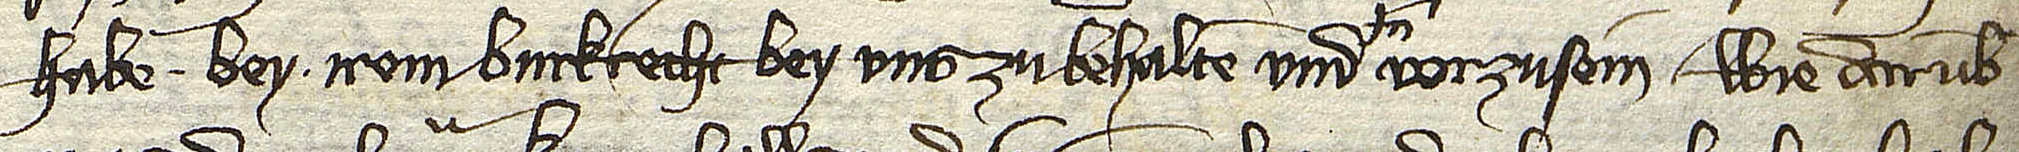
habe . bey . irem burkrecht bey vns ʒu behalte* vnd vor ʒuſein / Wie daru*b
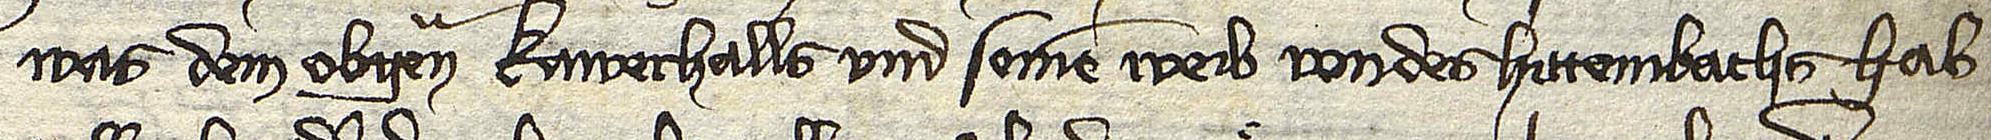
was dem obgen* kawerhalls vnd ſeine* weib von des hittembachs hab
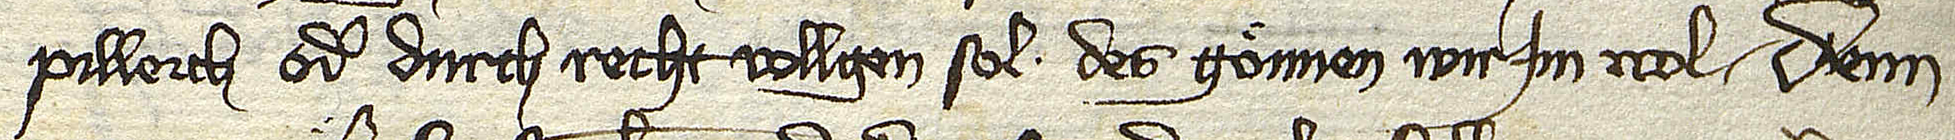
pilleich od* durch recht vollgen ſol . des gönnen wir Im wol / Denn
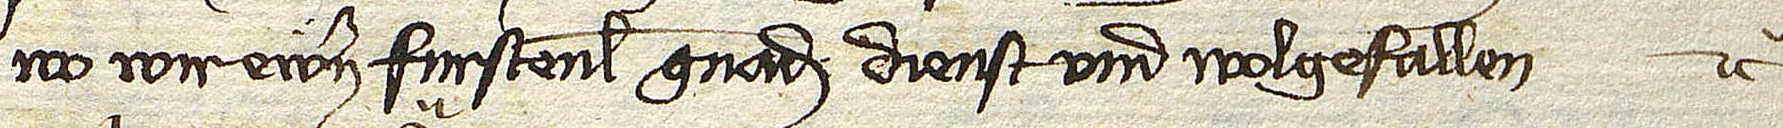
wo wir ew*n furſtenl* gnad* dienſt vnd wolgefallen ec*
